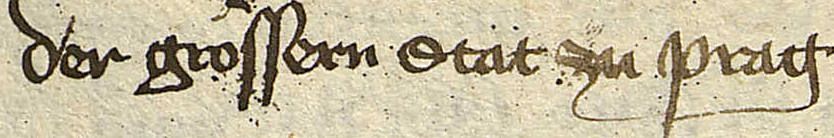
der gröſſern Stat cʒu Prag
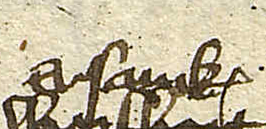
Erſamk*
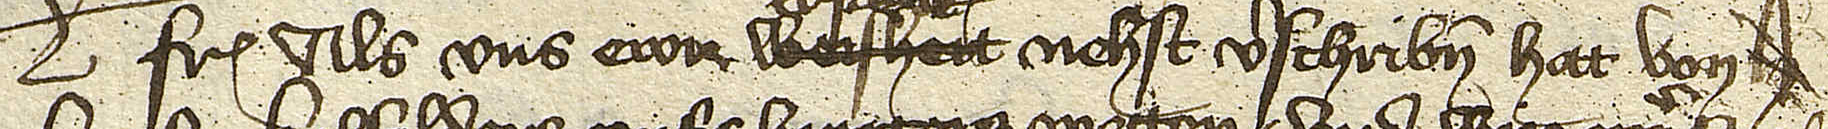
L* fr* Als vns ewr weiſheit nehſt v*ſchribn* hat von H
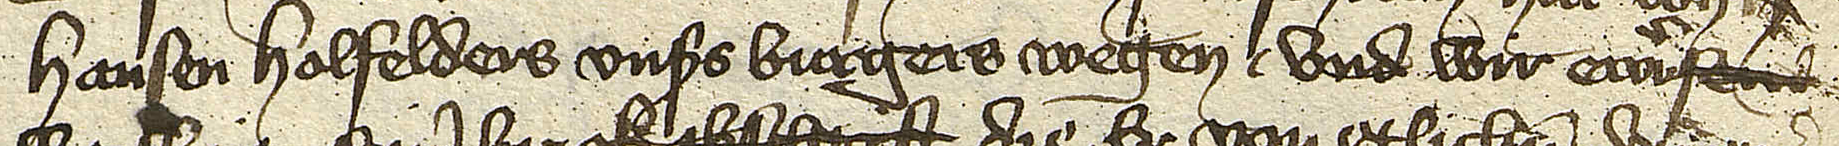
Hanſen Holfelders vnſ*s burgers wegen / vnd wir ewr* ſein*
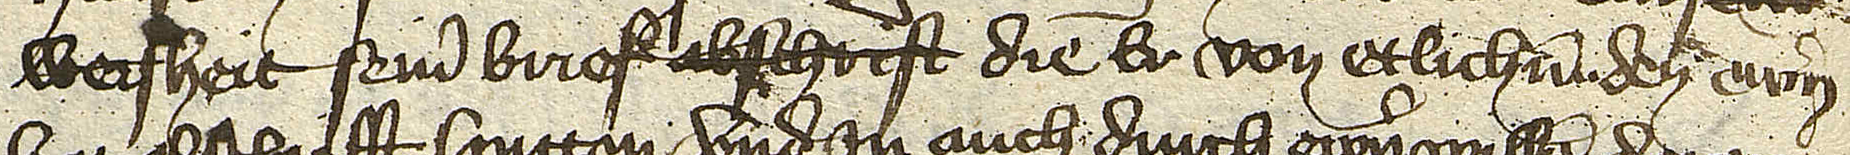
weiſheit ſein* brief abſchrift die Er von etlichn* ~ den ewr*n
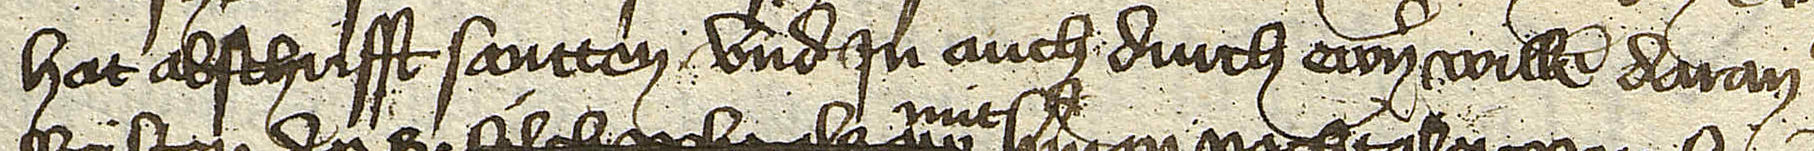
hat abſchrifft ſantten / vnd In auch durch ewn* wille* daran
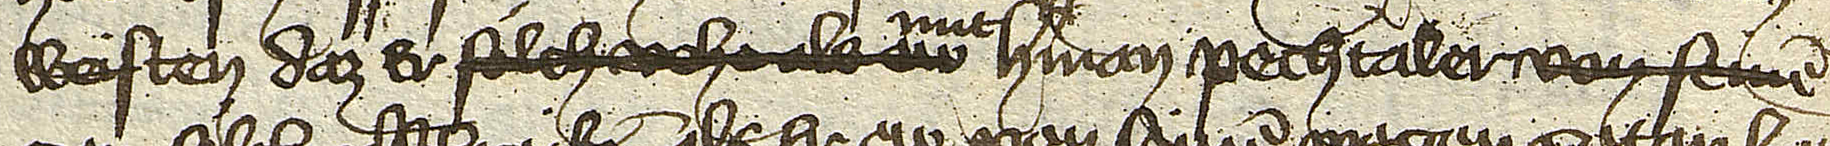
weiſten daʒ Er ſölch vehe als ew H*man Pechtaler von ſeine*
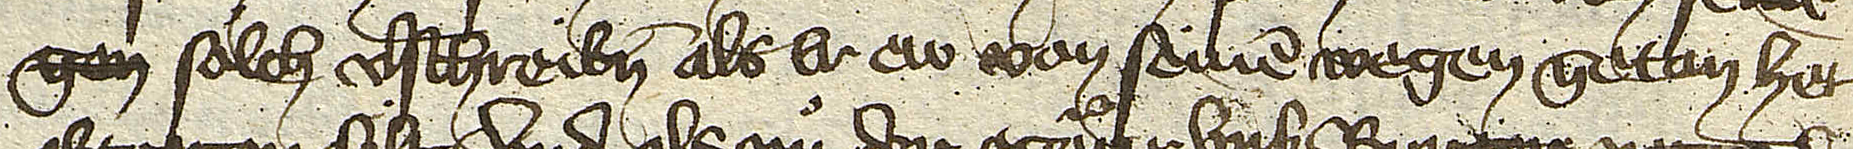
gen ſölch v*ſchreibn* als Er ew von ſeine* wegen getan het
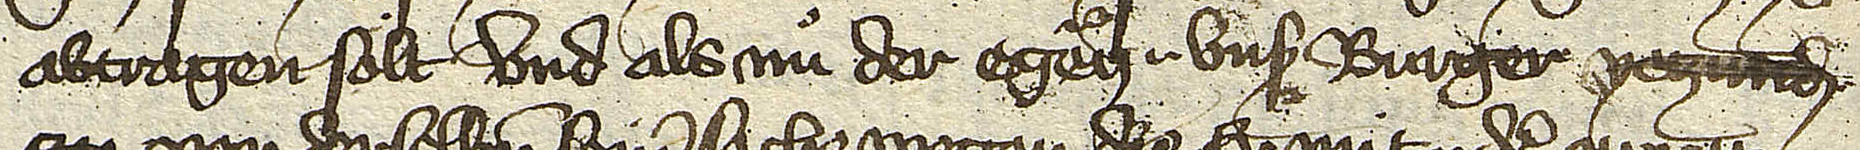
abtragen ſölt / vnd als nü der egen* ~ vnſ* Burger yecʒund*
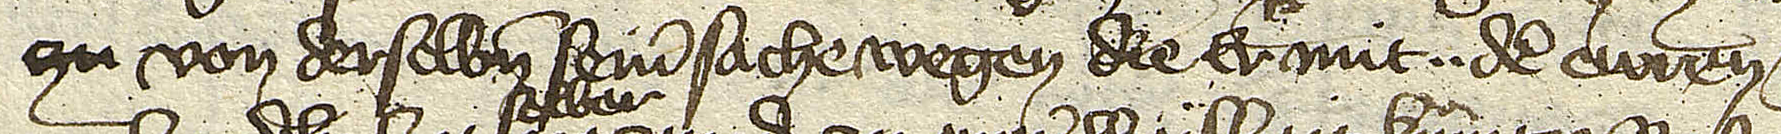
cʒu von derſelbn* ſein* ſache wegen die Er mit ~ d* ewren
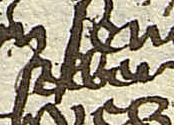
ſelber
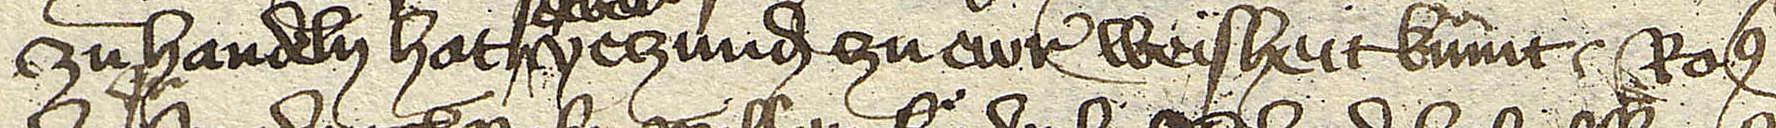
cʒu handeln hat yecʒund* cʒu ewr* weiſheit kümt / Ro*
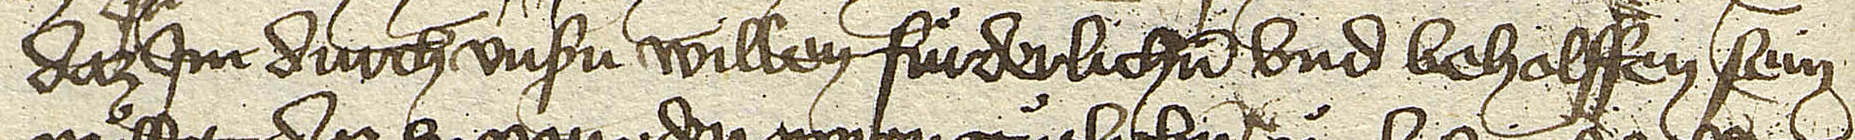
daʒ Im durch vnſ*n willen fürderlichn* vnd beholffen ſein
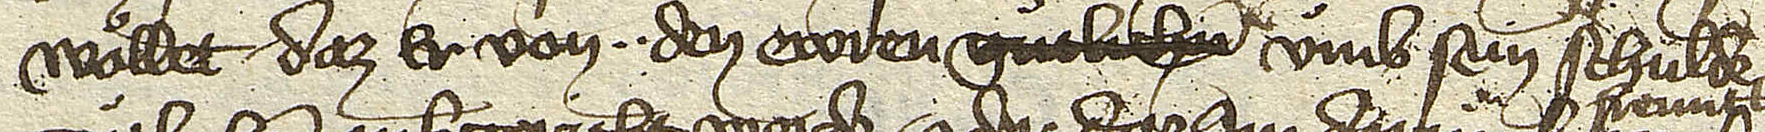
wöllet / daʒ Er von ~ den ewren gütlichn* v̈mb ſein ſchulde
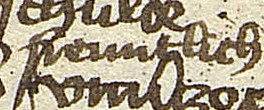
freuntlich
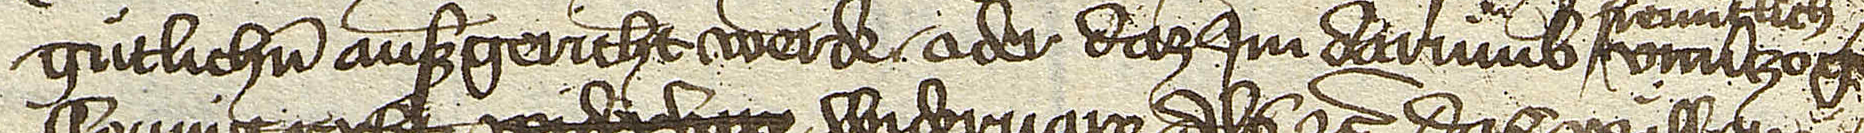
gütlichn* auſʒgericht werde / oder daʒ Im darümb vnu*cʒoge*
